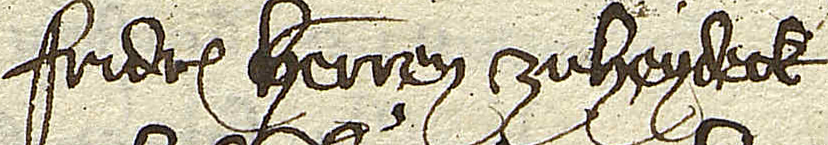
Fridr* herren cʒu heydeck
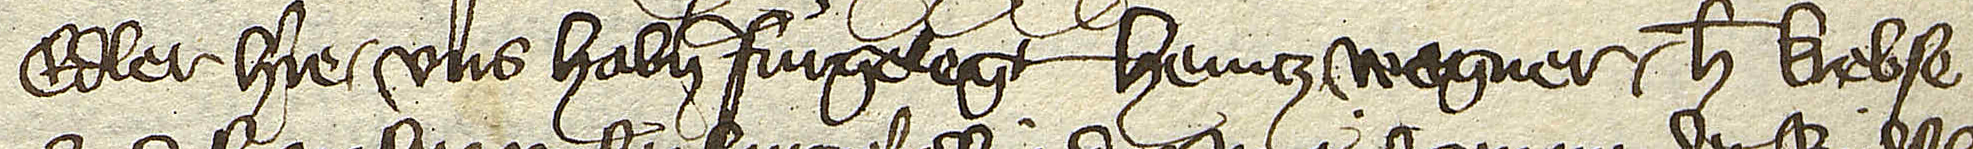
Edler h*re / vns habn* fürgelegt heincʒ wegner / h* krebſe
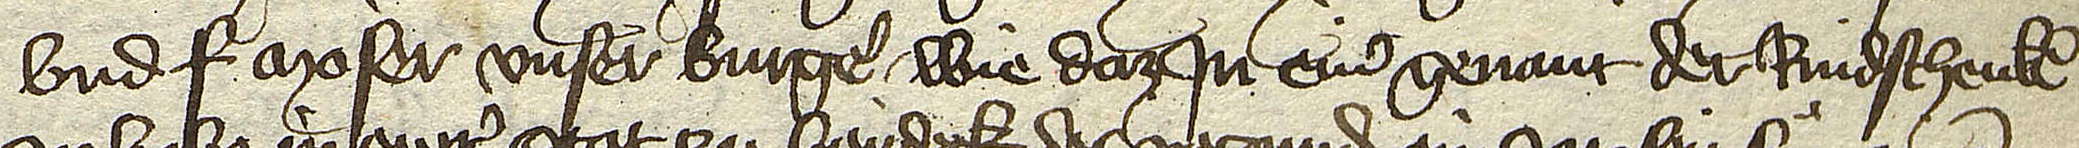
vnd f Moſer vnſer burge* / wie daʒ In ein* genant der Rindſchenke*
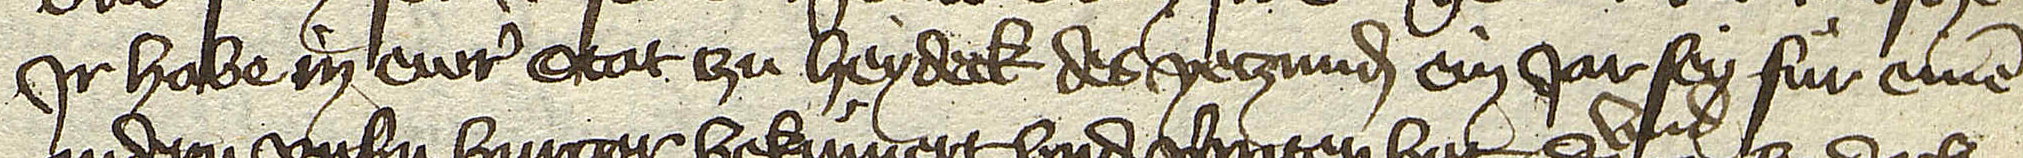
Ir habe in ewr* Stat cʒu heydeck des yecʒund* ein Iar ſey für eine*
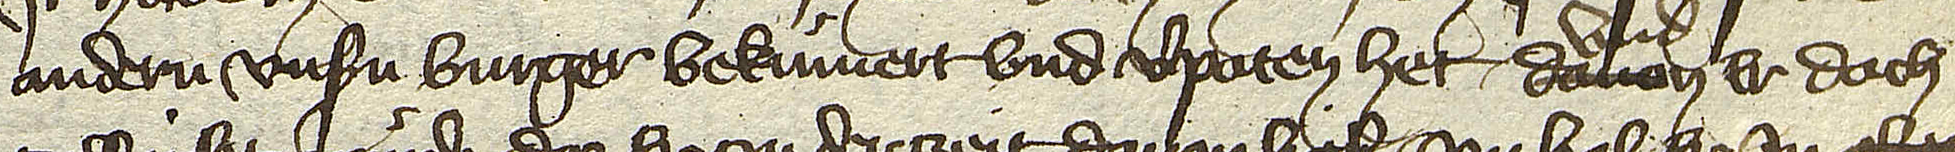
andern vnſ*n burger bekümert vnd v*poten het / dauon Er doch
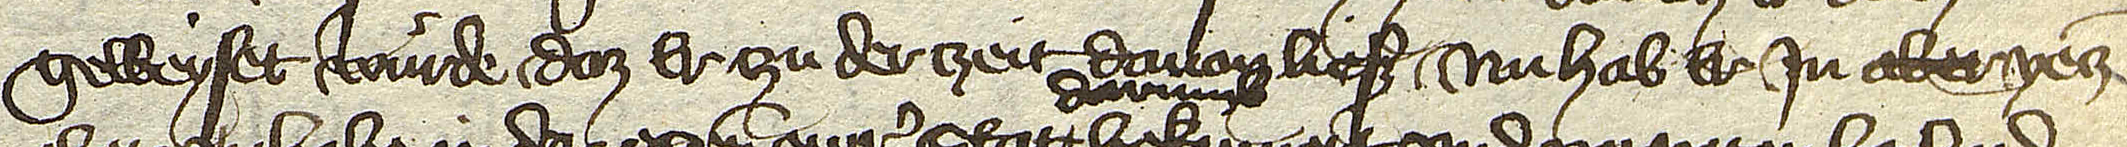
geweyſet würde / daʒ Er cʒu der cʒeit dauon lieſʒ / Nu hab Er In aber yecʒ*
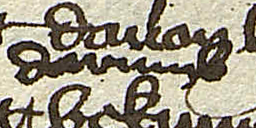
darumb
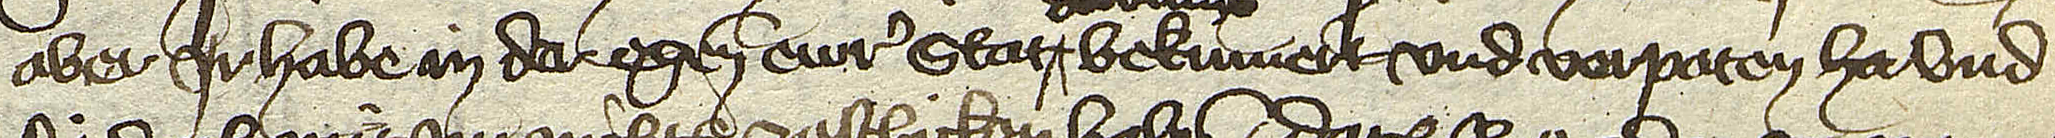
aber Ir habe in der egen* ewr* Stat bekümert vnd verpoten ha vnd
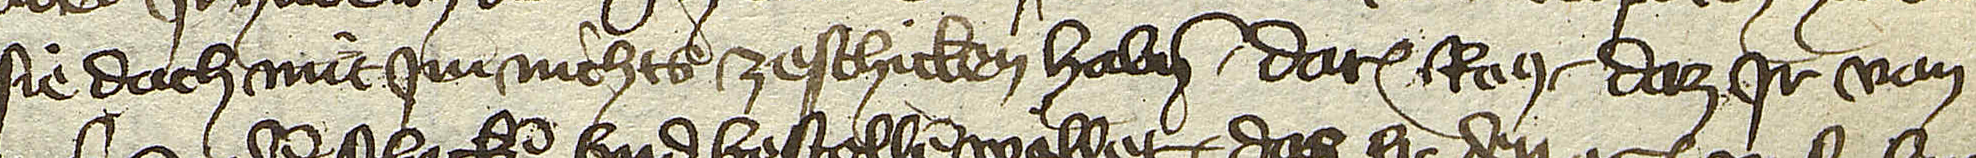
ſie doch mit Im nichts cʒeſchicken habn* / dar* Ro* / daʒ Ir von
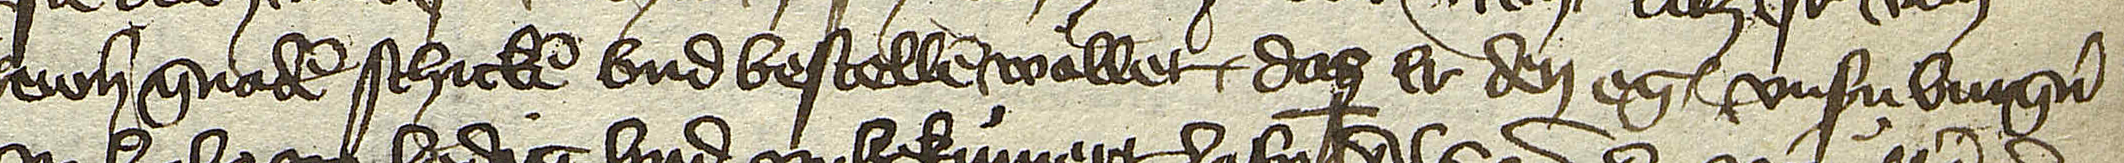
ewn* gnade* ſchicke* vnd beſtelle* wöllet / daʒ Er den eg* vnſ*n burgn*
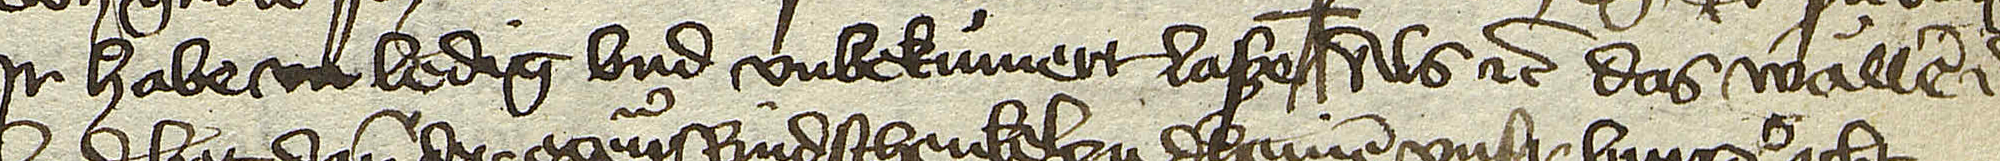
Ir habe vn ledig vnd vnbekümert laſʒe / Als ec* das wölle* ec*
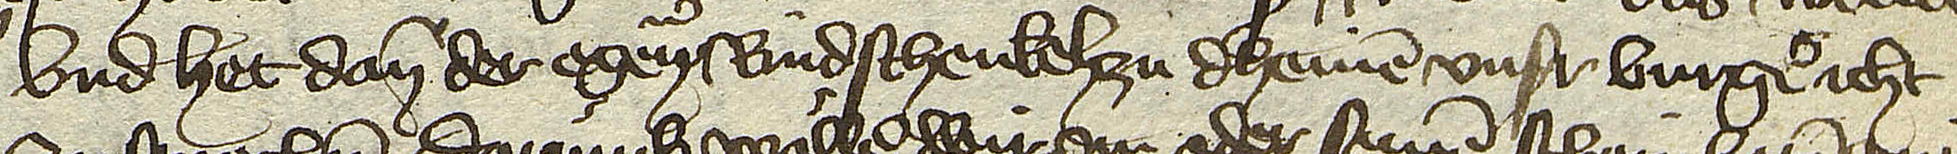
vnd het dan* der egen* Rindſchenkel cʒu dheine* vnſ*r burge* icht
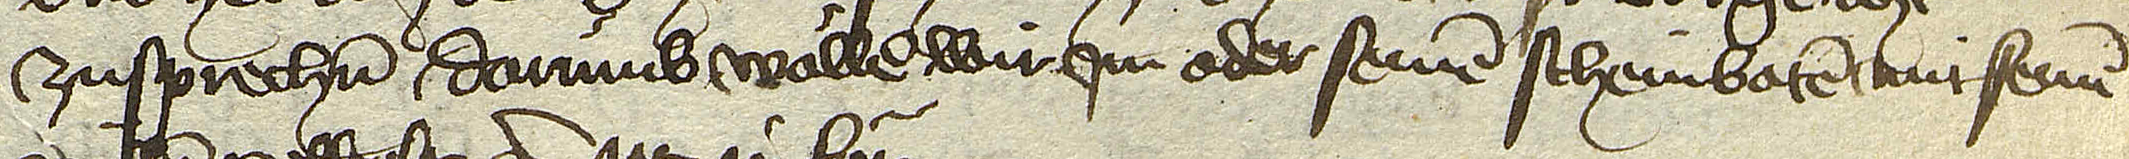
cʒuſprechn* / darümb wölle* wir Im oder ſeine* ſcheinbote* mit ſeine*
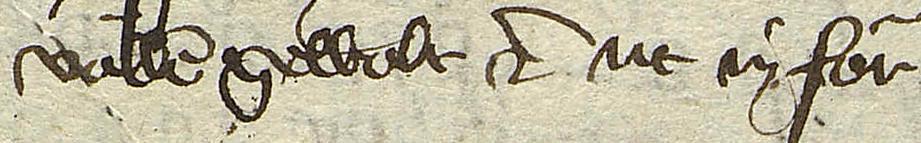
volle* gewalt* ec* ut in for*
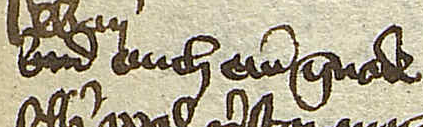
vnd auch ew* gnade
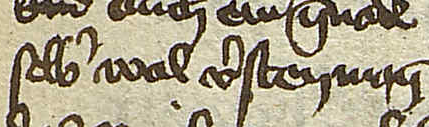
ſelb* wol v*ſten mag
